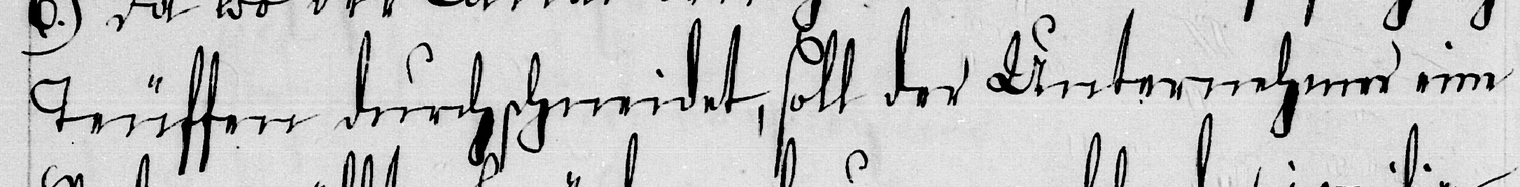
Teuffen durchschneidet, soll der Unternehmer eine
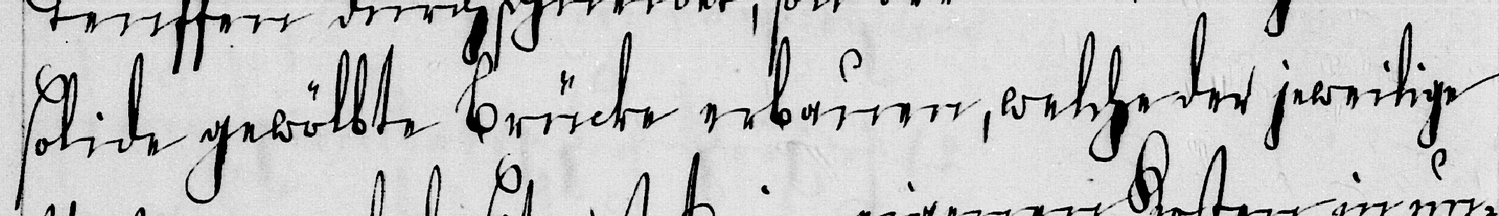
solide gewölbte Brücke erbauen, welche der jeweilige
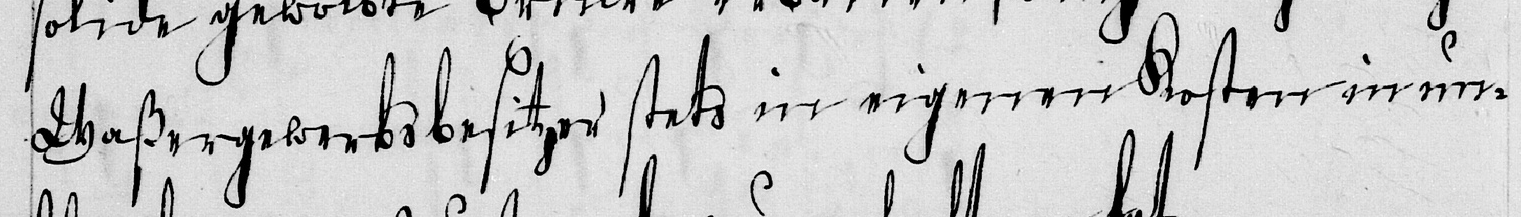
Waßerwerksbesitzer stets in eigenen Kosten in un¬
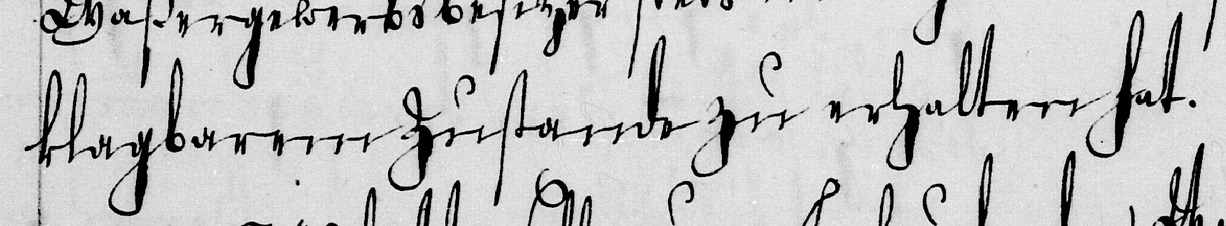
klagbarem Zustande zu erhalten hat.
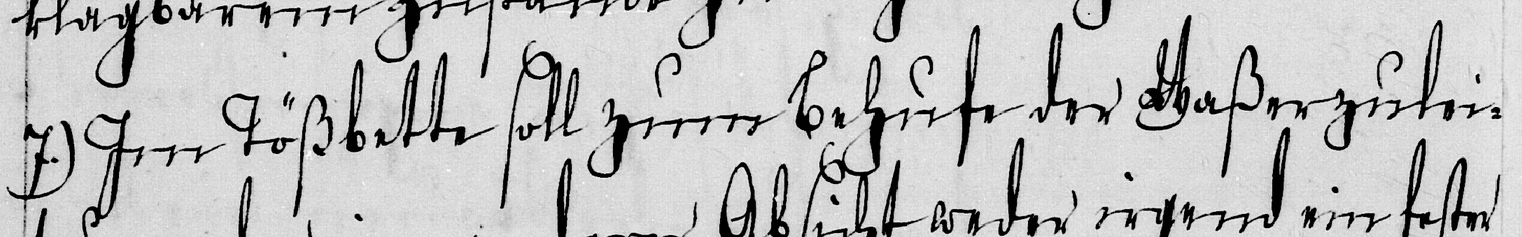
7.) Im Tößbette soll zum Behufe der Waßerzulei¬
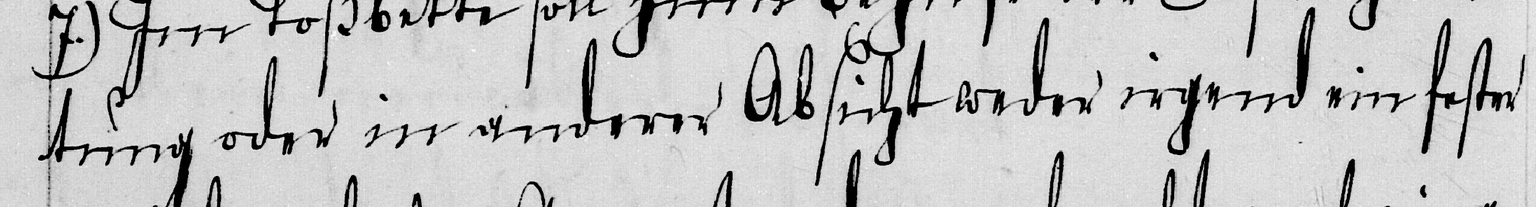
tung oder in anderer Absicht weder irgend ein fester
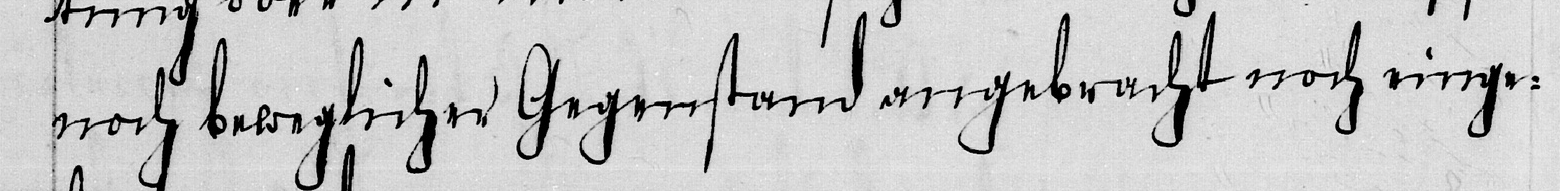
noch beweglicher Gegenstand angebracht noch einge¬
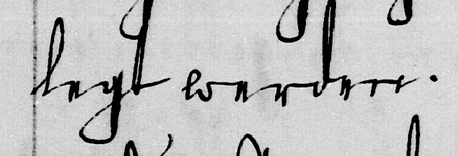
legt werden.
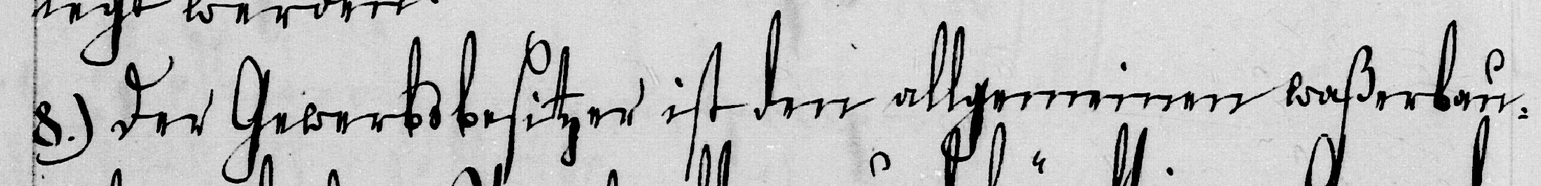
8.) Der Gewerbsbesitzer ist den allgemeinen waßerbau¬
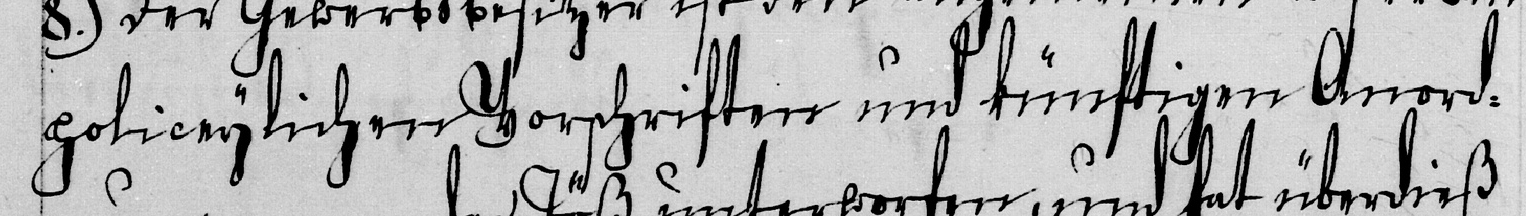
policeylichen Vorschriften und künftigen Anord¬
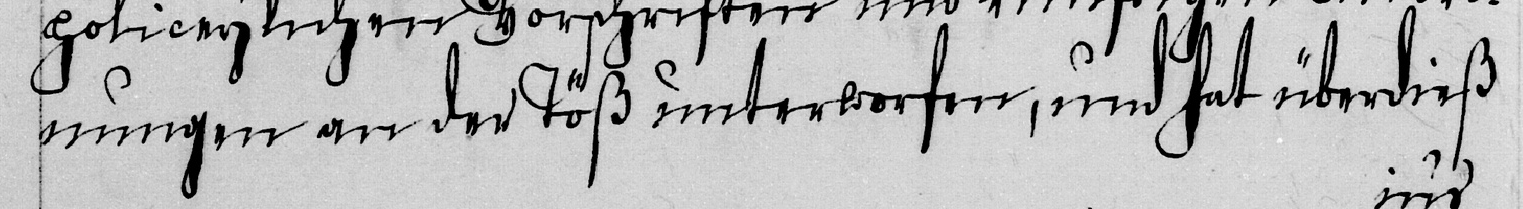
nungen an der Töß unterworfen, und hat überdieß
